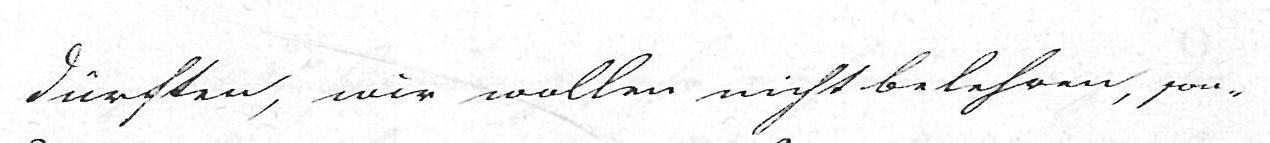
dürften, wir wollen nicht belehren, son-
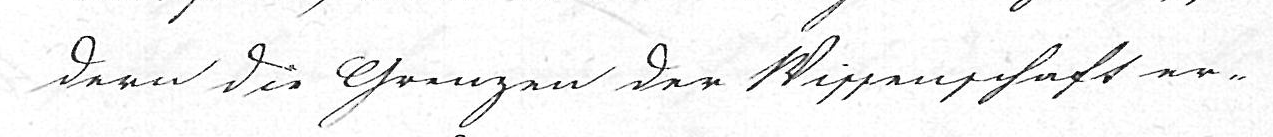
dern die Grenzen der Wissenschaft er-
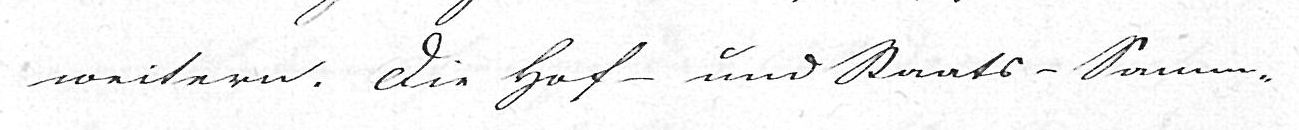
weiteren. Die Hof- und Staats-Samm-
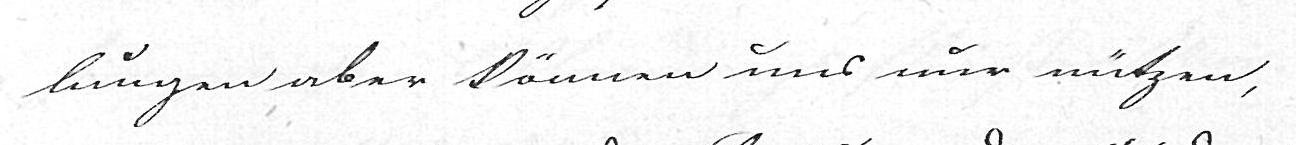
lungen aber können und nur nützen,
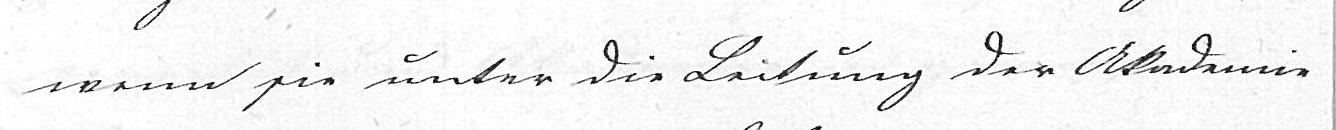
wenn sie unter die Leitung der Akademie
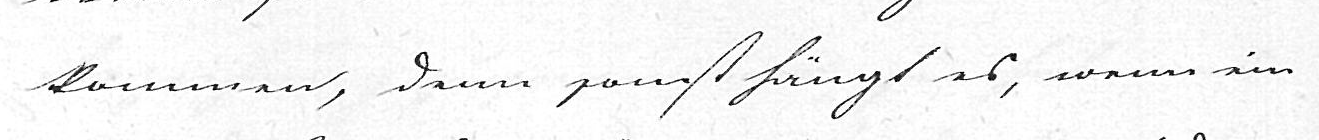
kommen, den sonst hängt es, wenn ein
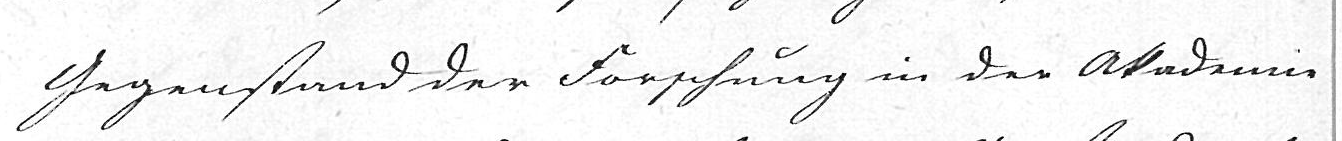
Gegenstand der Forschung in der Akademie
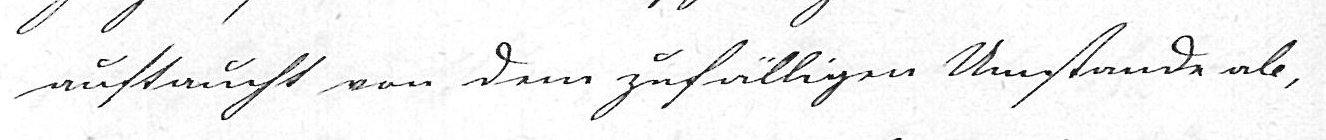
auftaucht von dem zufälligen Umstande ab,
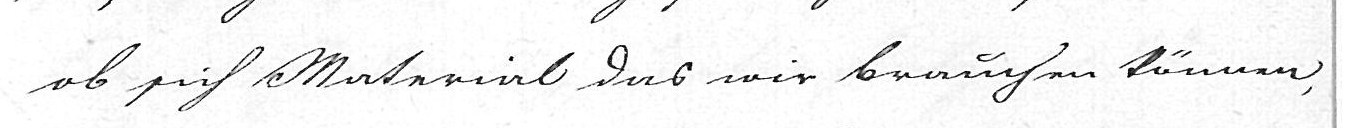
ob sich Material das wir brauchen können,
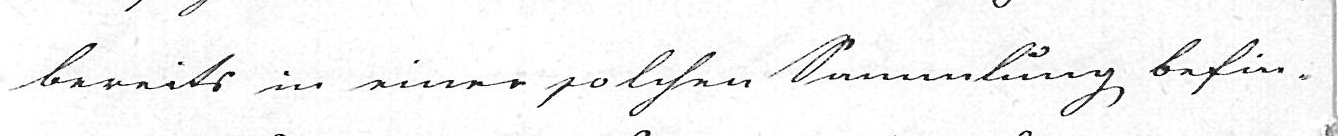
bereits in einer solchen Sammlung befin-
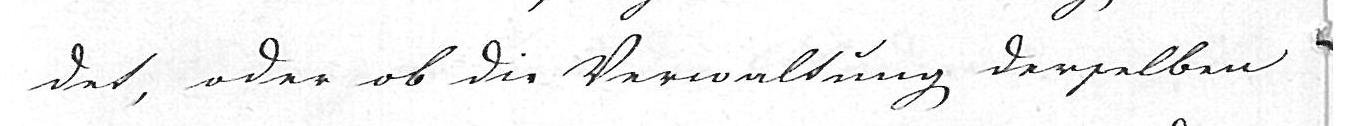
det, oder ob die Verwaltung derselben
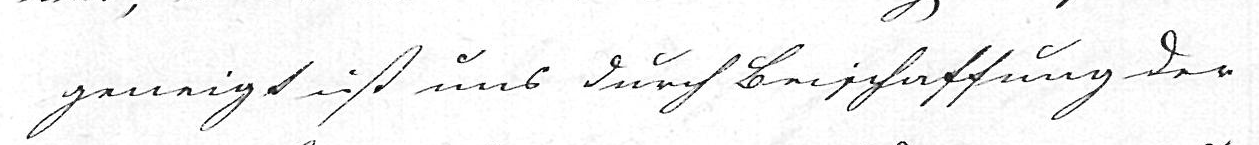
geneigt ist uns durch Beischaffung der
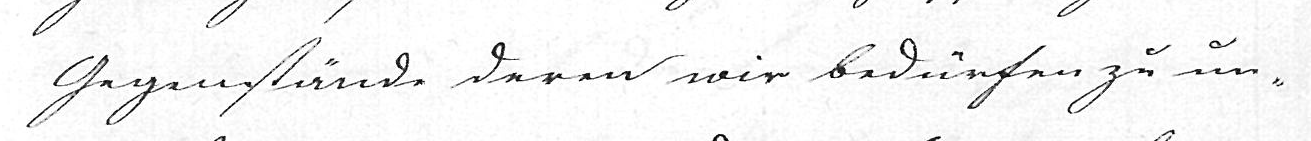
Gegenstände deren wir bedürfen zu un-
